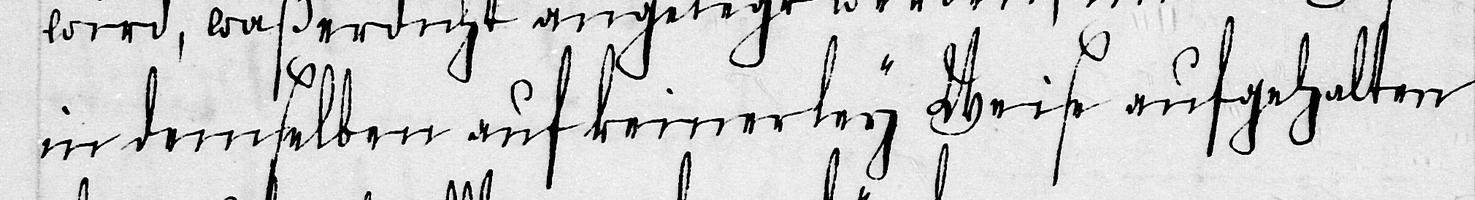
in demselben auf keinerley Weise aufgehalten
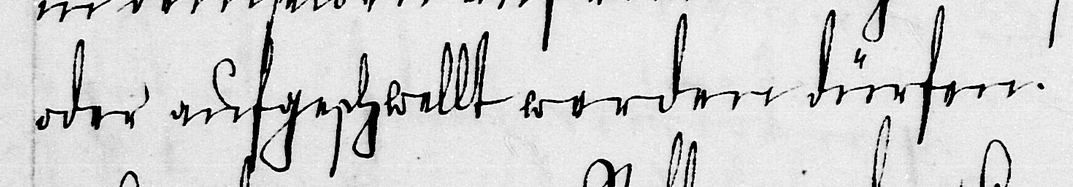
oder aufgeschwellt werden dürfen.
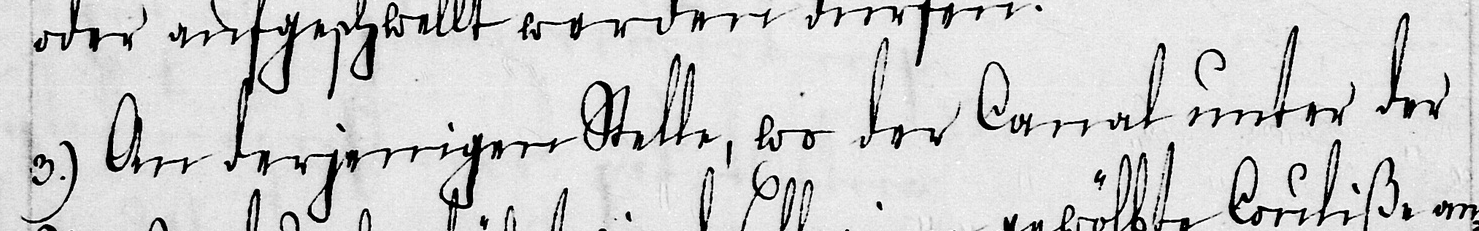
3.) An derjenigen Stelle, wo der Canal unter der
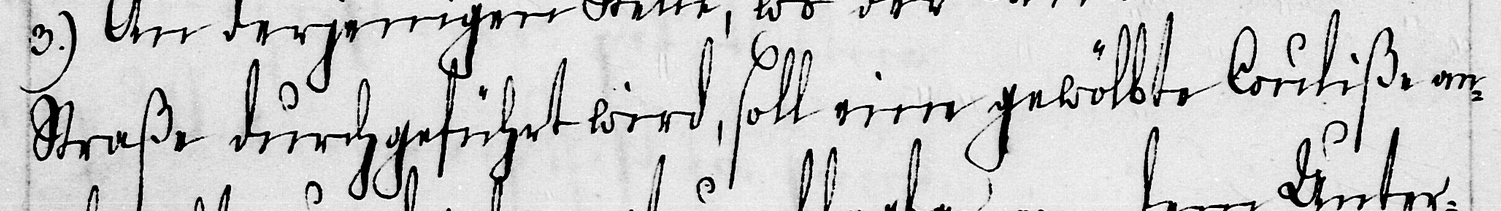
Straße durchgeführt wird, soll eine gewölbte Couliße an¬
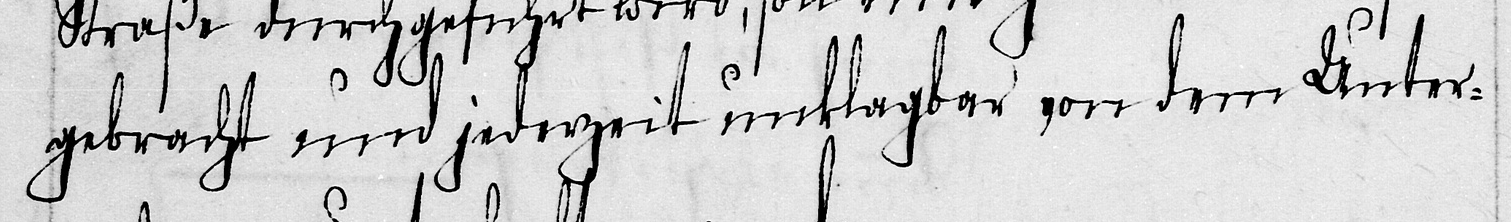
gebracht und jederzeit unklagbar von dem Unter¬
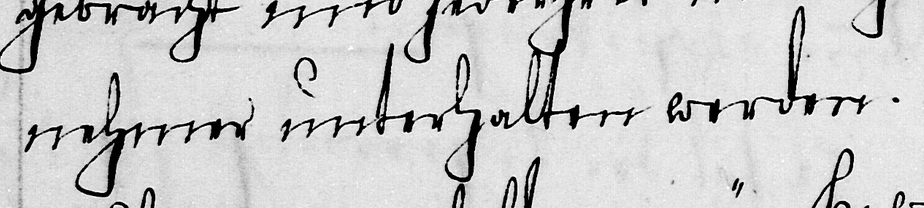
nehmer unterhalten werden.
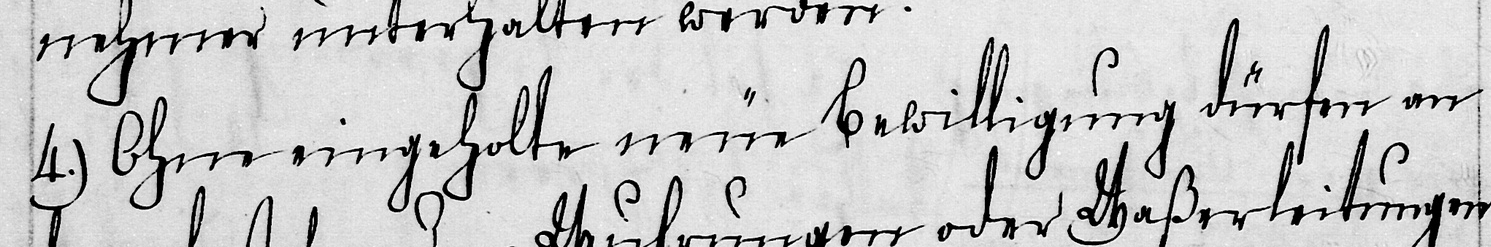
4.) Ohne eingeholte neue Bewilligung dürfen an
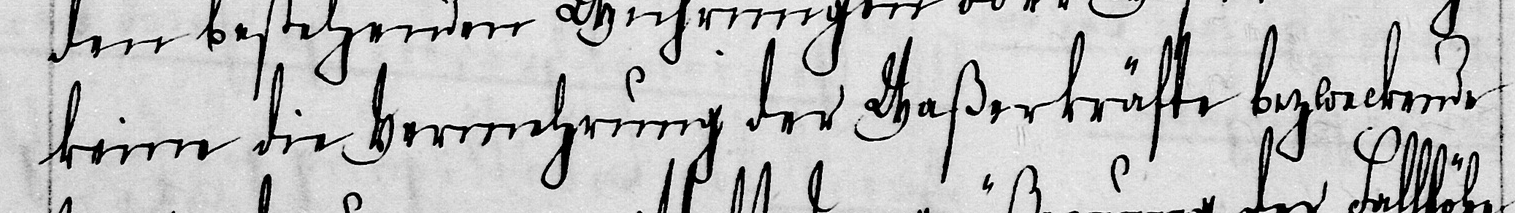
keine die Vermehrung der Waßerkräfte bezweckende
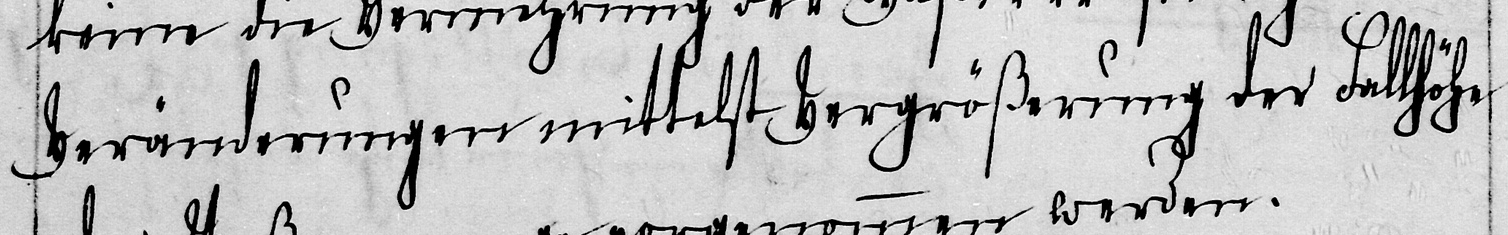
Veränderungen mittelst Vergrößerung der Fallhöhe
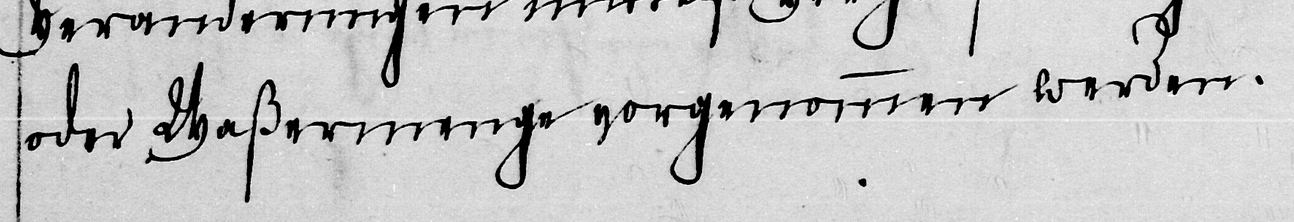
oder Waßermenge vorgenommen werden.
